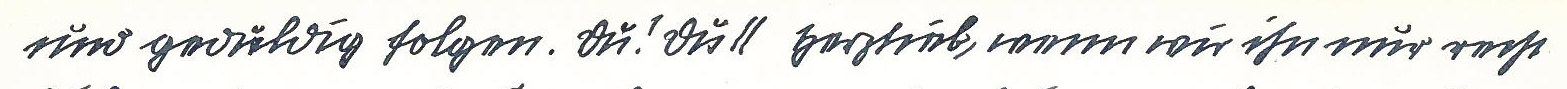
und geduldig folgen. Du! Du!! Herzlieb, wenn wir ihn nur recht
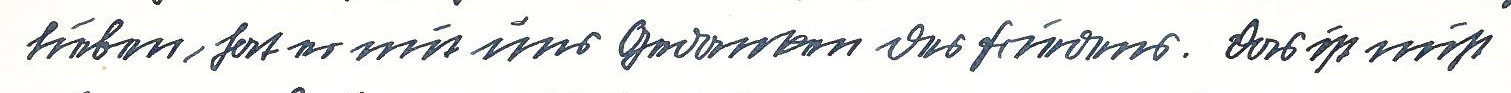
lieben, hat er mit uns Gedanken des Friedens. Das ist nicht
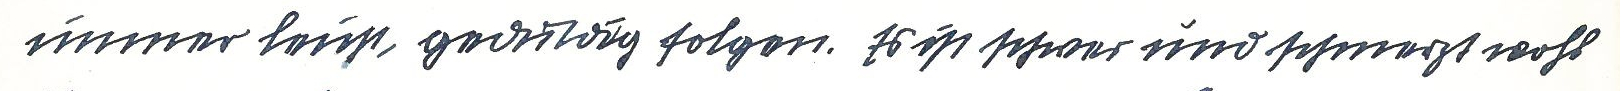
immer leicht, geduldig folgen. Es ist schwer und schmerzt wohl
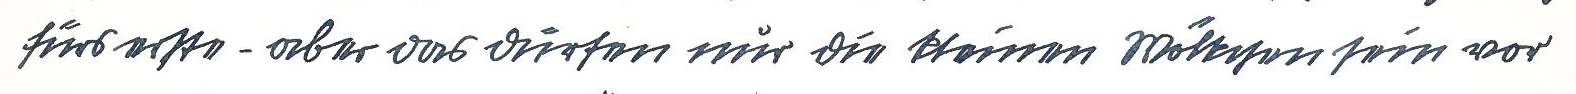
fürs erste – aber das dürfen nur die kleinen Wölkchen sein vor
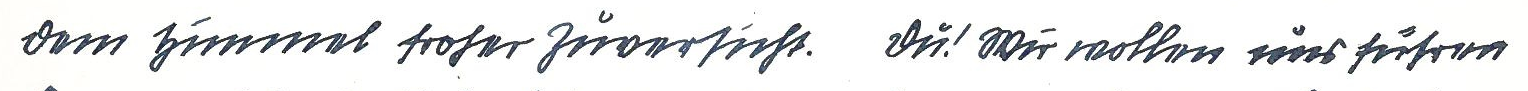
dem Himmel froher Zuversicht. Du! Wir wollen uns führen
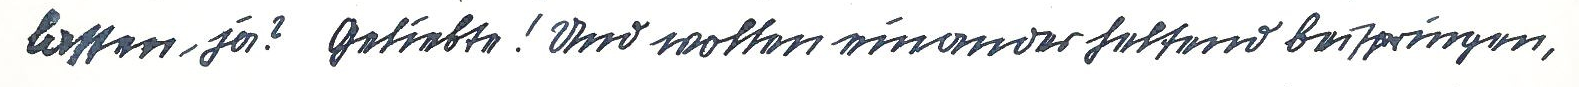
lassen, ja? Geliebte! Und wollen einander helfend beispringen,
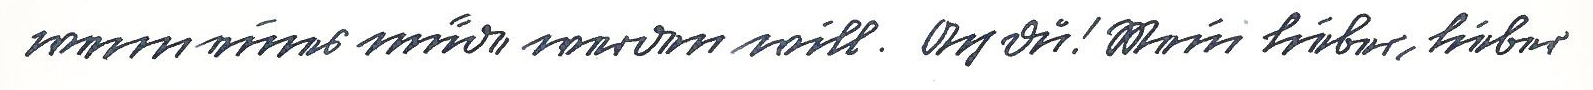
wenn eines müde werden will. Ach Du! Mein lieber, lieber
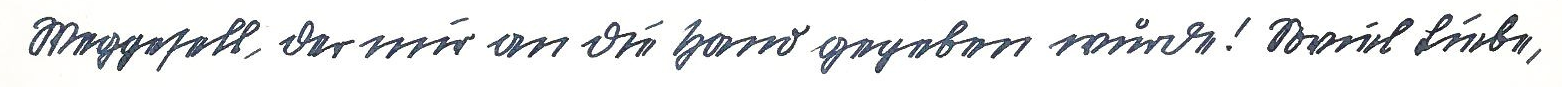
Weggesell, der mir an die Hand gegeben wurde! Soviel Liebe,
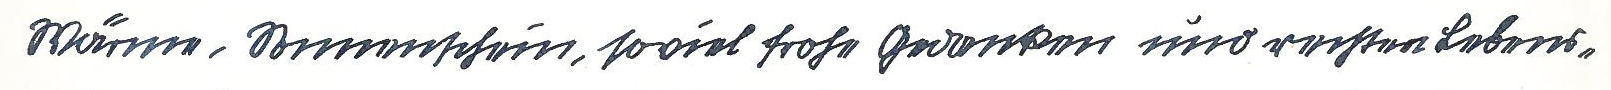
Wärme, Sonnenschein, soviel frohe Gedanken und rechten Lebens¬
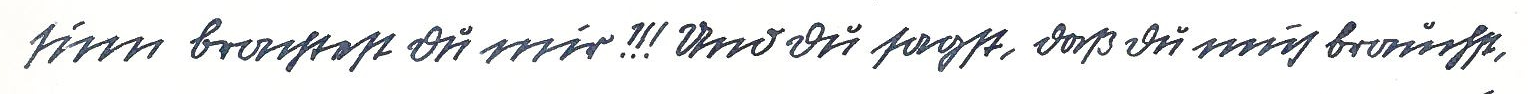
sinn brachtest Du mir!!! Und Du sagst, daß Du mich brauchst,
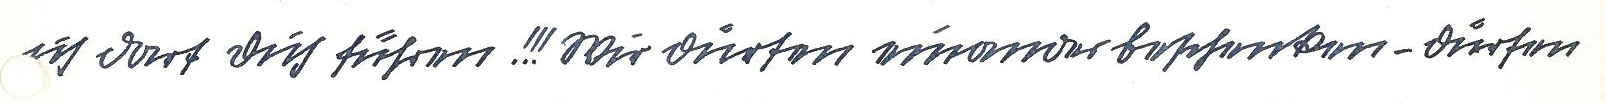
ch darf Dich führen!!! Wir dürfen einander beschenken – dürfen
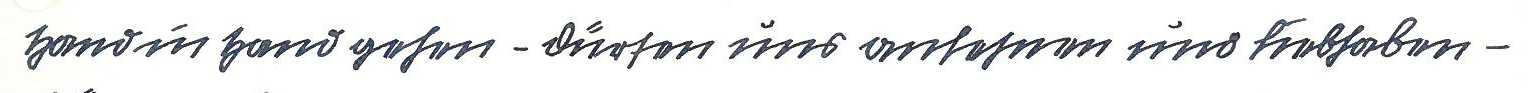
Hand in Hand gehen – dürfen uns anlehnen und liebhaben –
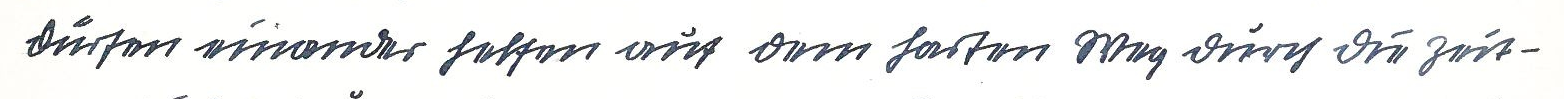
dürfen einander helfen auf dem harten Weg durch die Zeit –
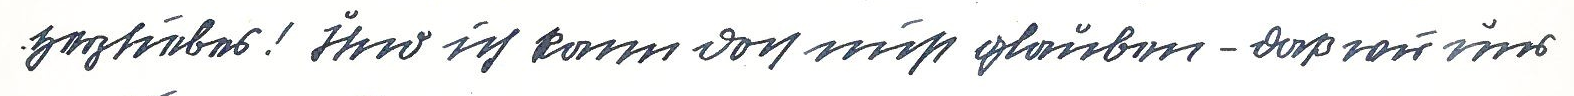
Herzliebes! Und ich kann doch nicht glauben – daß wir uns
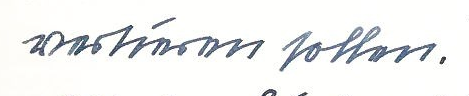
verlieren sollen.
